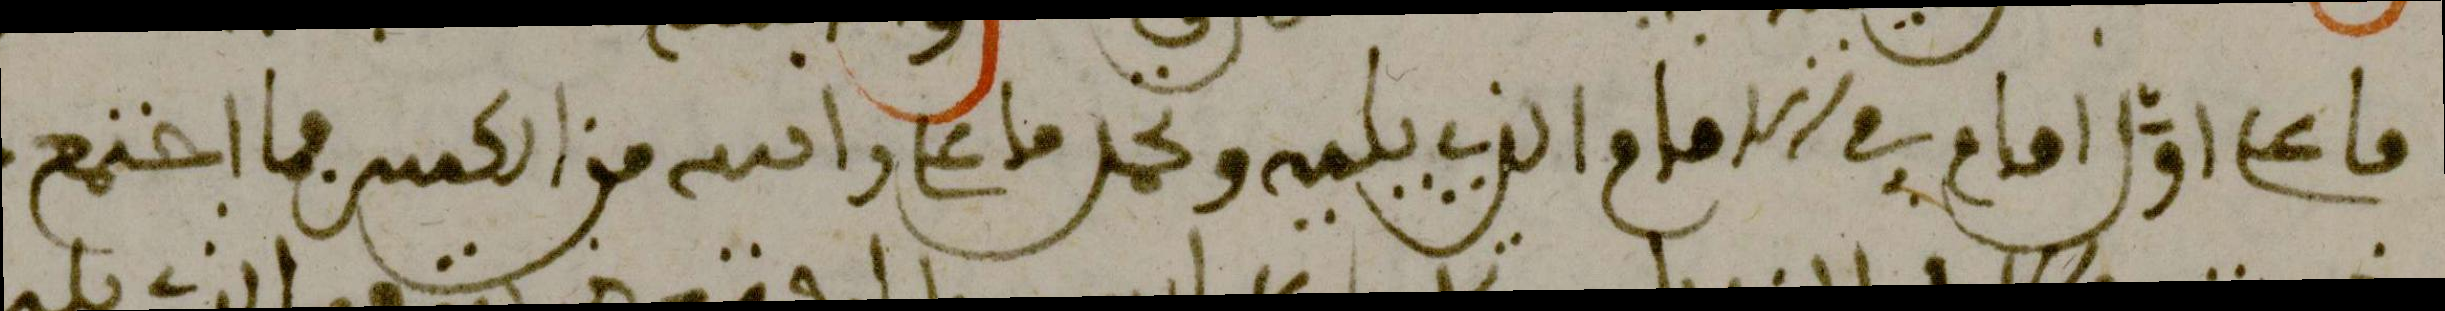ماعلى اوّل امام في الامام الذي يليه و تحمل ما على راسه من الكسر فما اجتمع
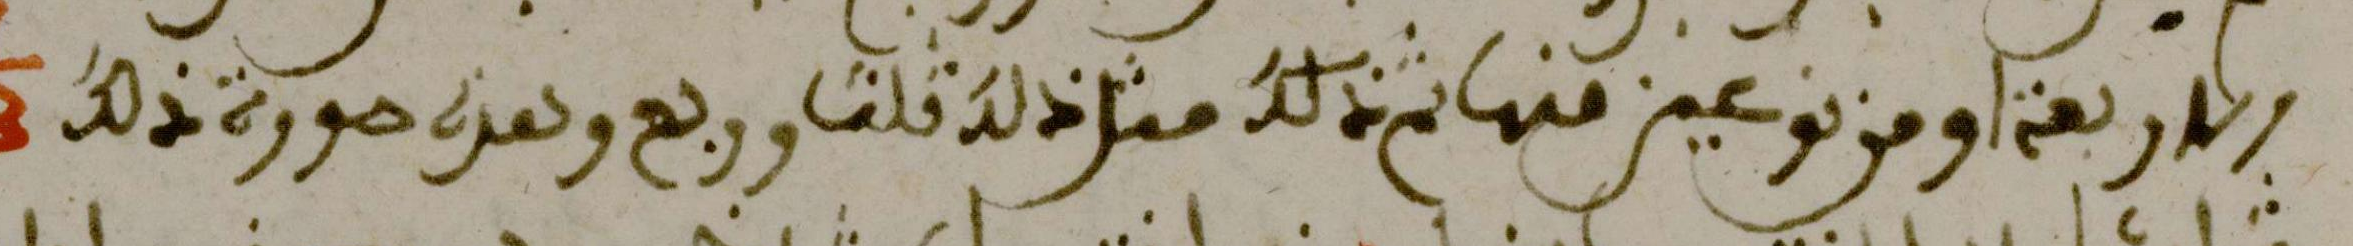الاربعة او من نوعين منها ثم ذلك مثل ذلك ثلث و ربع و هذه صورة ذلك
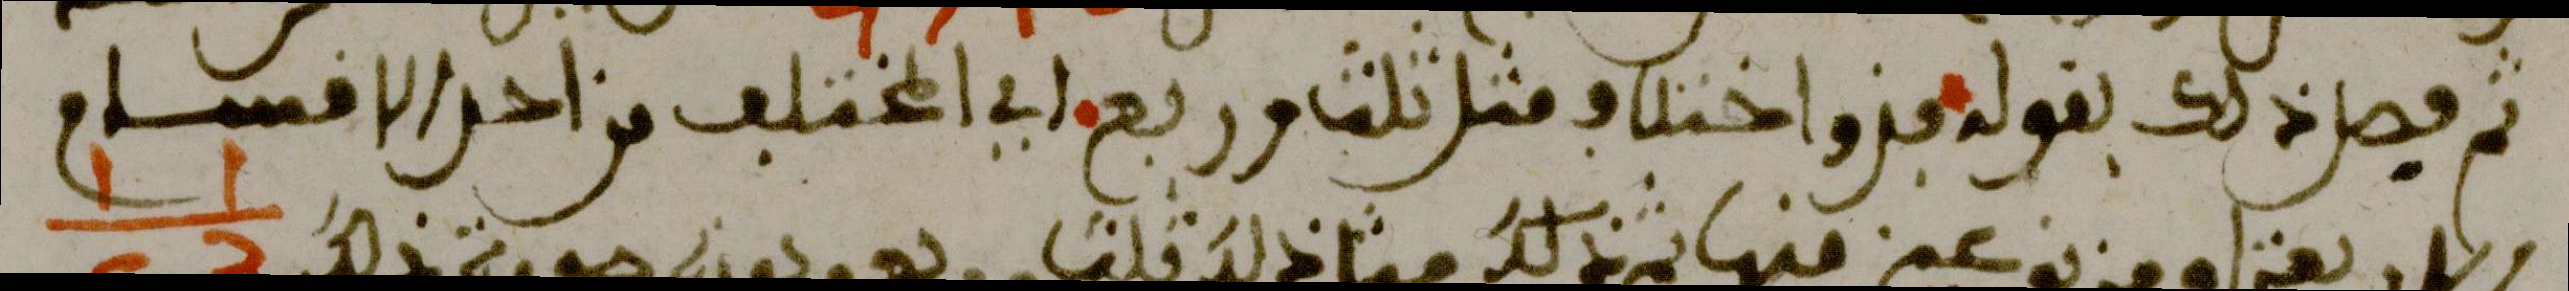ثم فصل ذلك بقوله فذ و اختلاف مثل ثلث و ربع اي المختلف من احد الاقسام
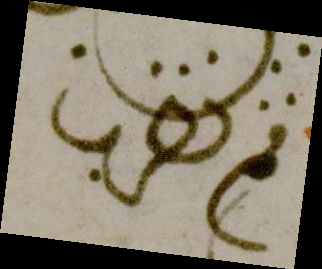ثم تضرب
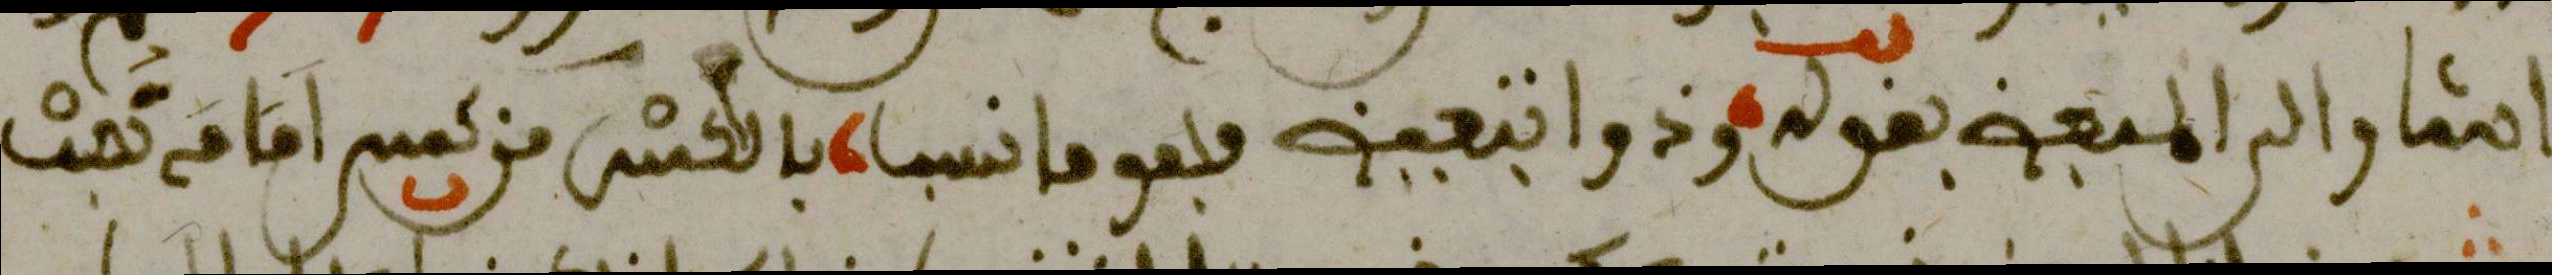اشار الى المبعض بقوله و ذواتبعيض فهو ما نسب بالكسر من كسر امامه نصب
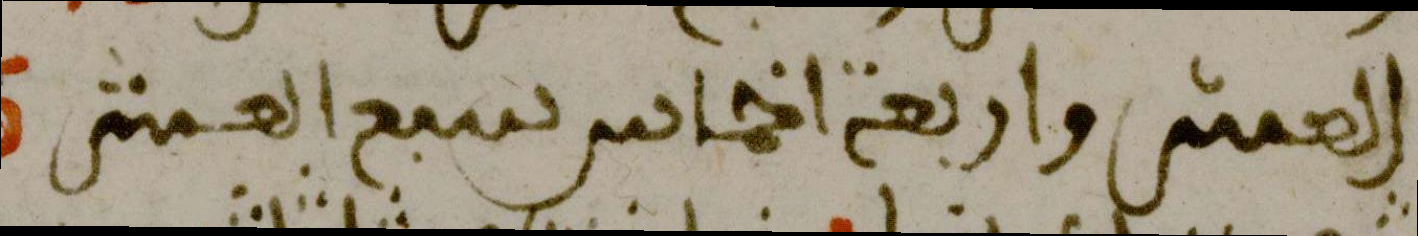العشر و اربعة اخماس سبع العشر
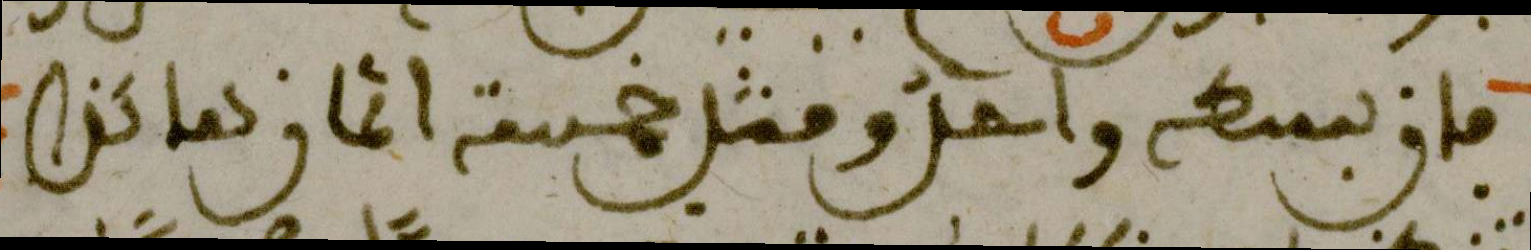فان بسطه واحد و مثل خمسة اثمان هاكذا
